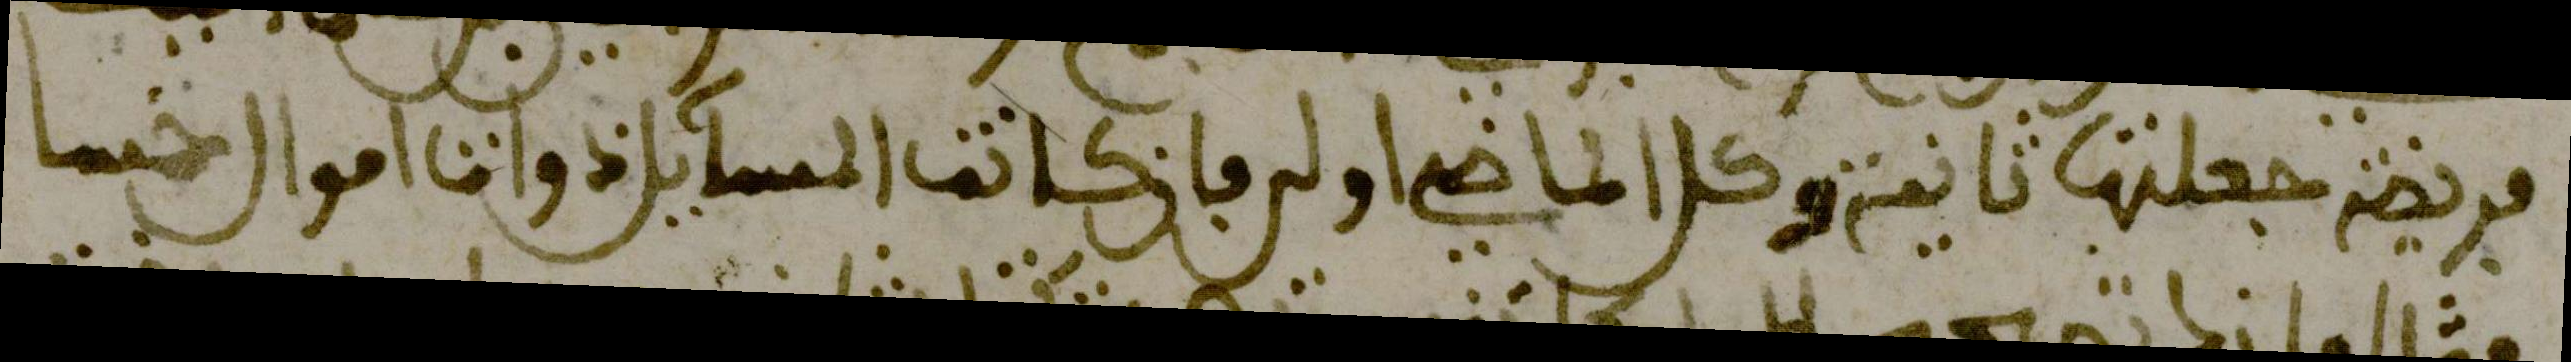فريضة جعلتها ثانية وكل الماضي اولى فان كانت المسايل ذوات اموال خمسا
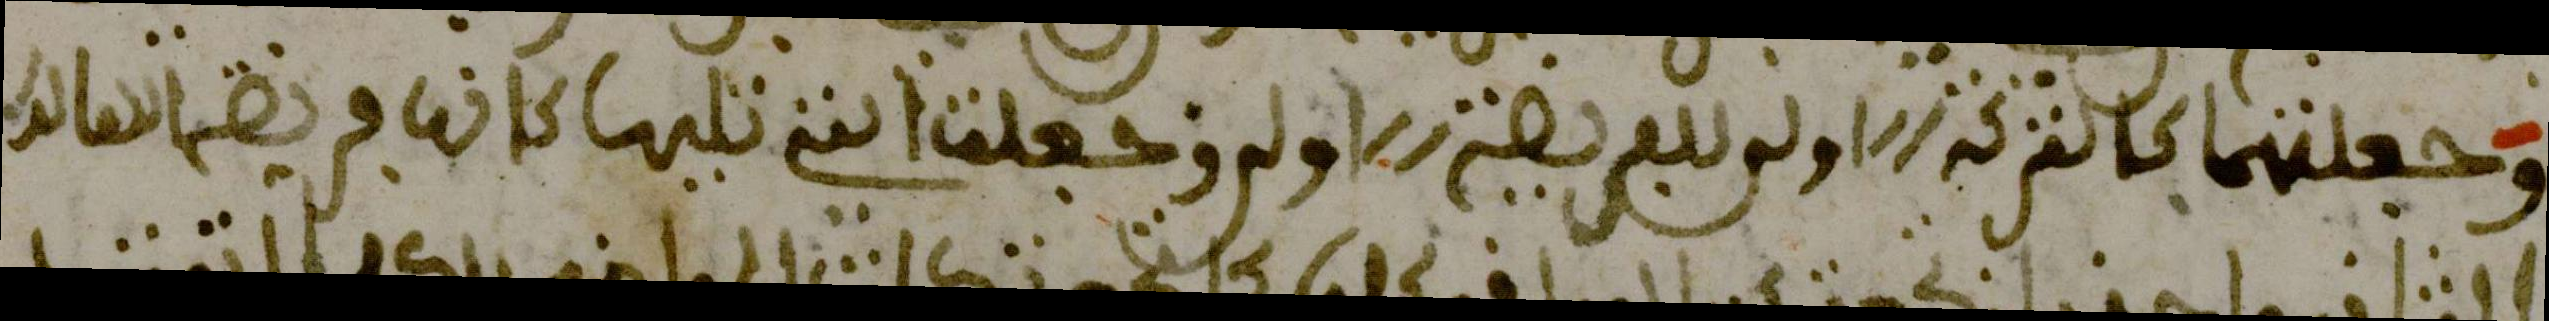وَجعلتها كالتركة الاولى للفريضة الاولى وجعلت التي تليها كانها فريضها الهالك
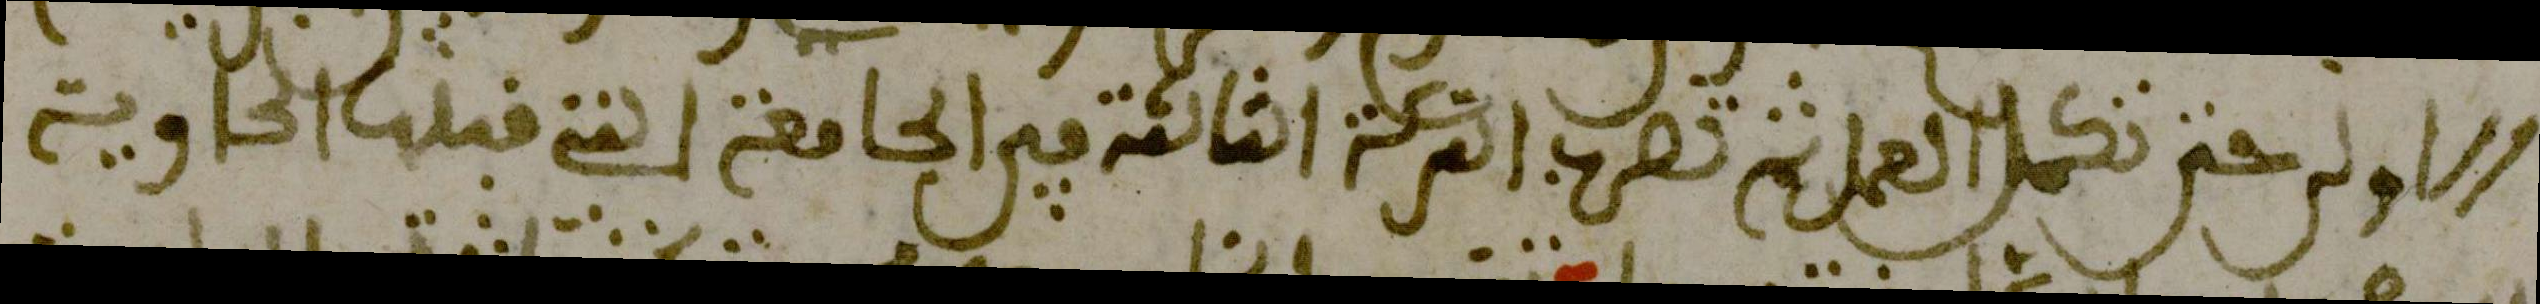الاولى حتى تكمل العمل ثم تضرب التركة الثالثة في الجامعة التي قبلها الحاوية
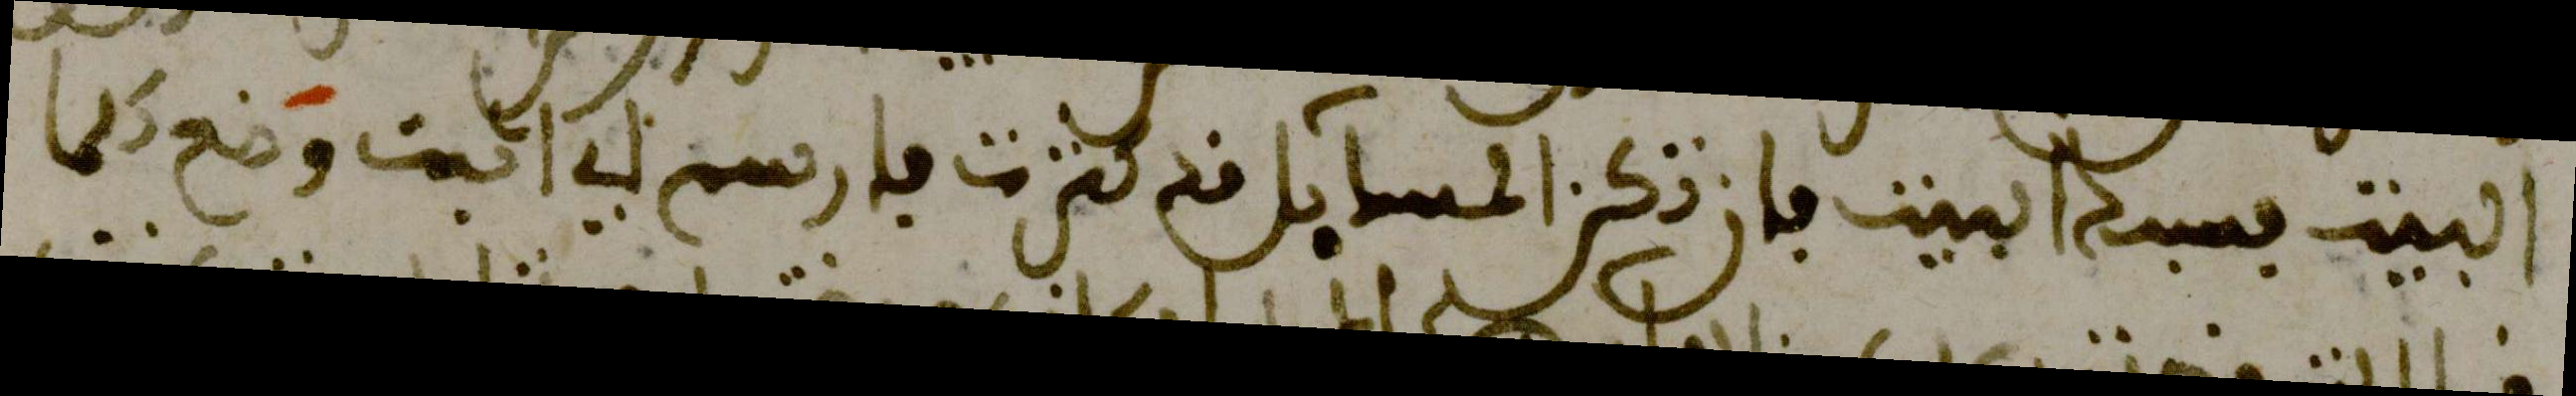البيت فسبك البيت فان تكن المسائل قد كثرت فارسم اي اثبت وَضع كلما
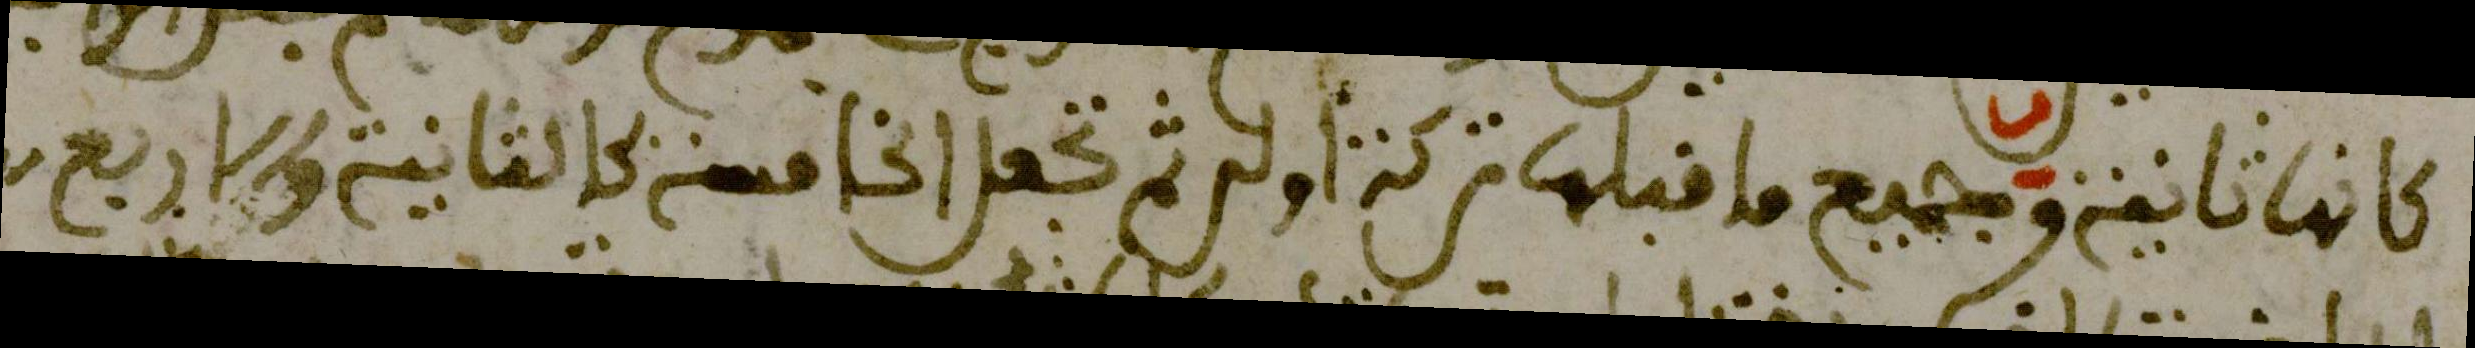كانها ثانية وَجميع ما قبلها تركة اولى ثم تجعل الخامسة كالثانية والاربع
